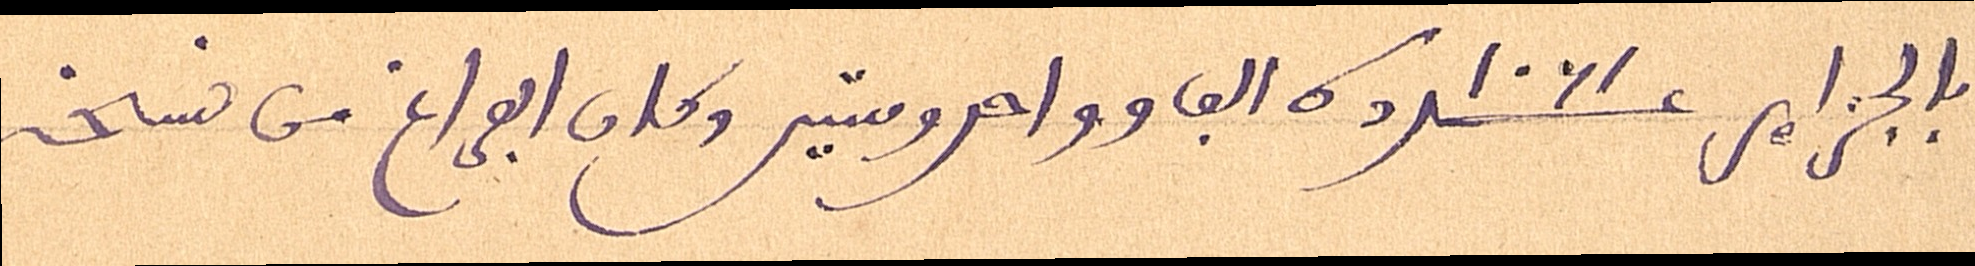بالجزائر عدده الف وواحد وستين وكان الفراغ من نسخه
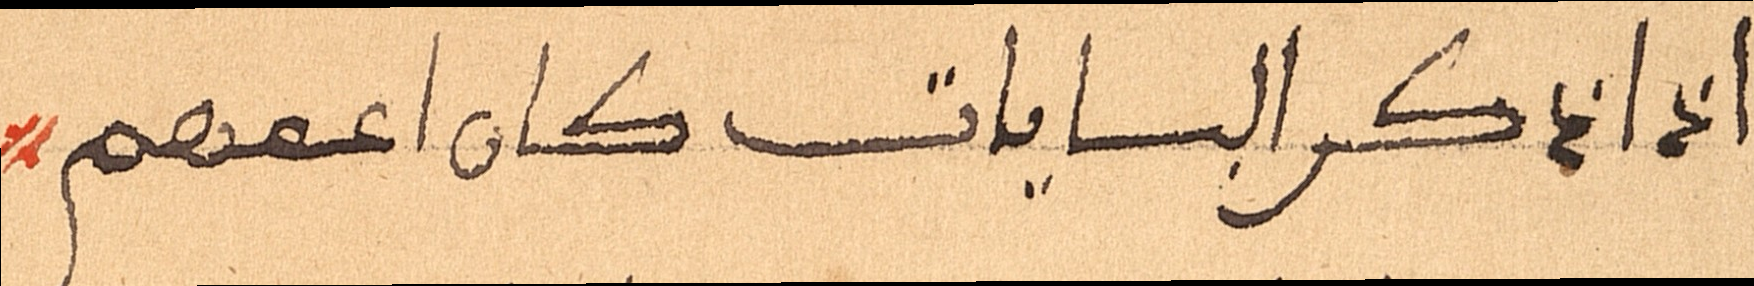اذا ذكر البايات كان اعمهم
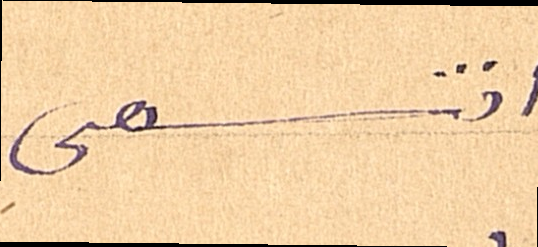انتهى
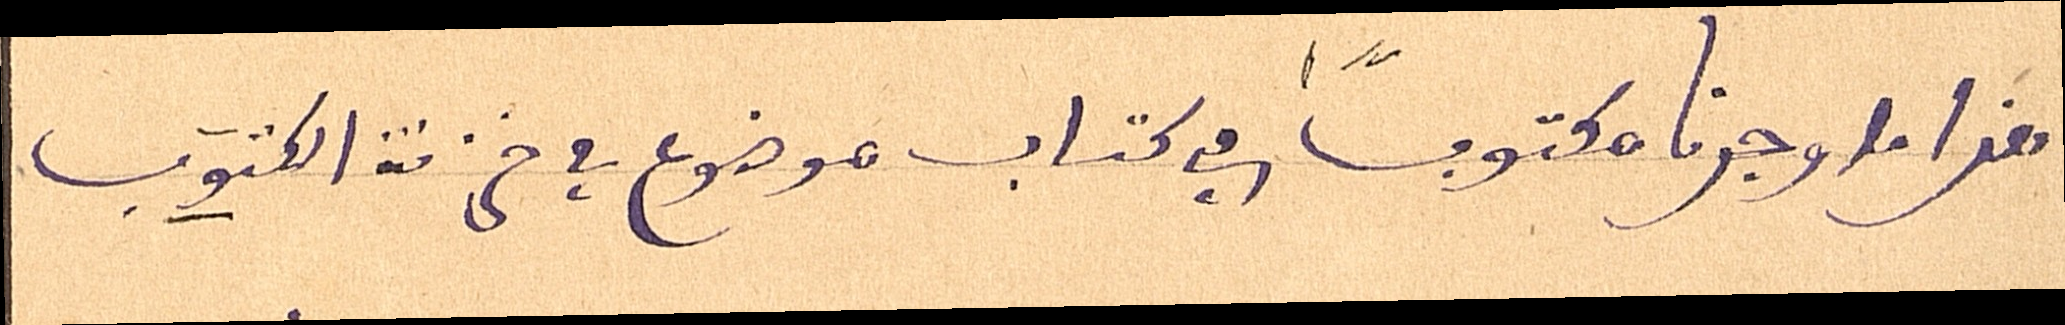هذا ما وجدنا مكتوب في كتاب موضوع في خزنة الكتوب
